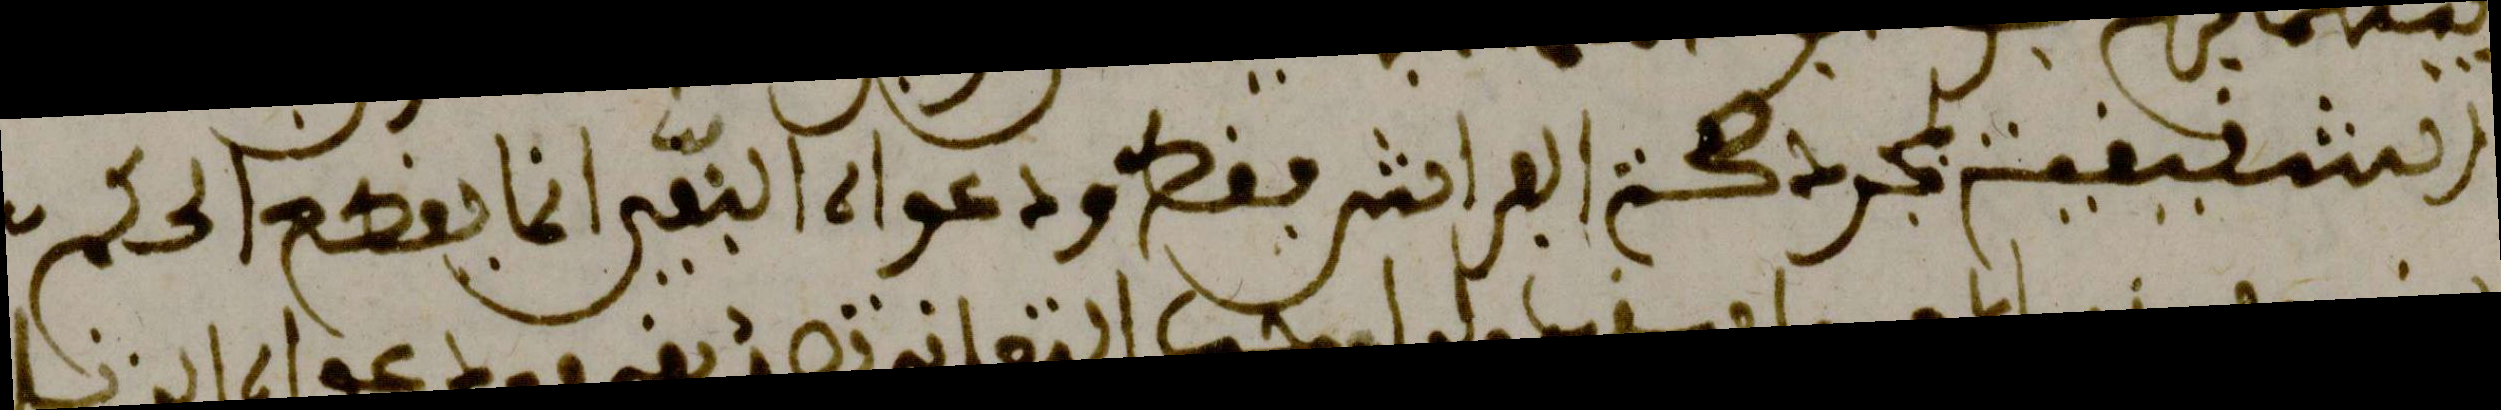الشقيقية لمجرد صحة الفراش فقط و دعواه النّفي انما يقطع الحكم
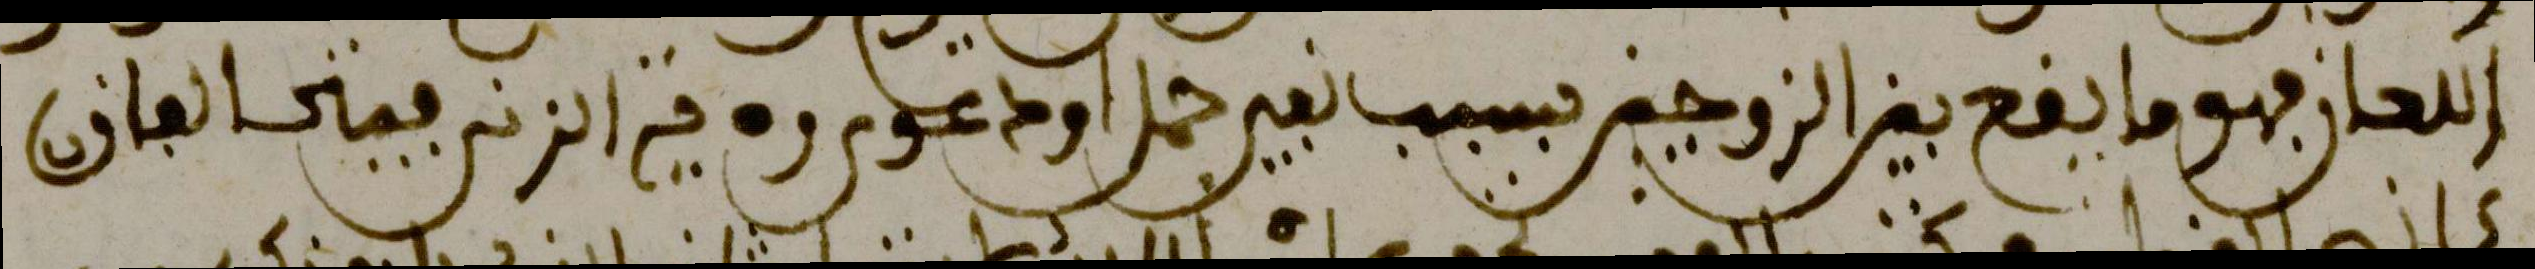اللعان فهو ما يقع بين الزوجين بسبب نفي جمل او دعوى رءية الزنى فيتحا لفان
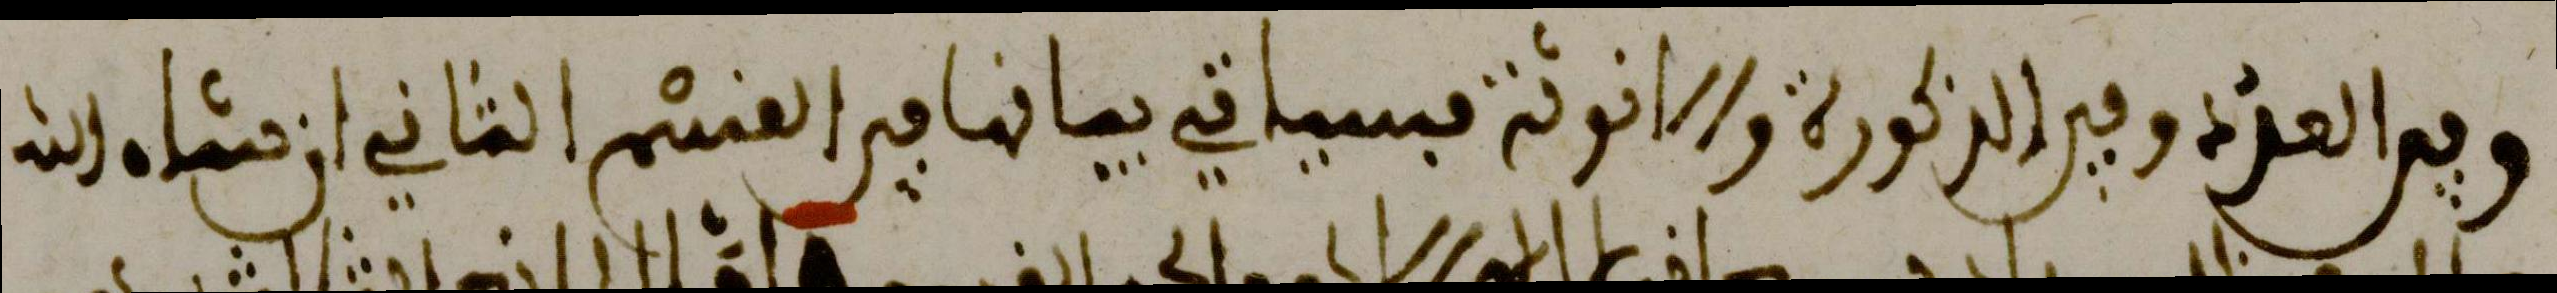وفي العدد و في الذكورة و في الانوثة فسياتي بيانها في القسم الثاني ان شاء الله
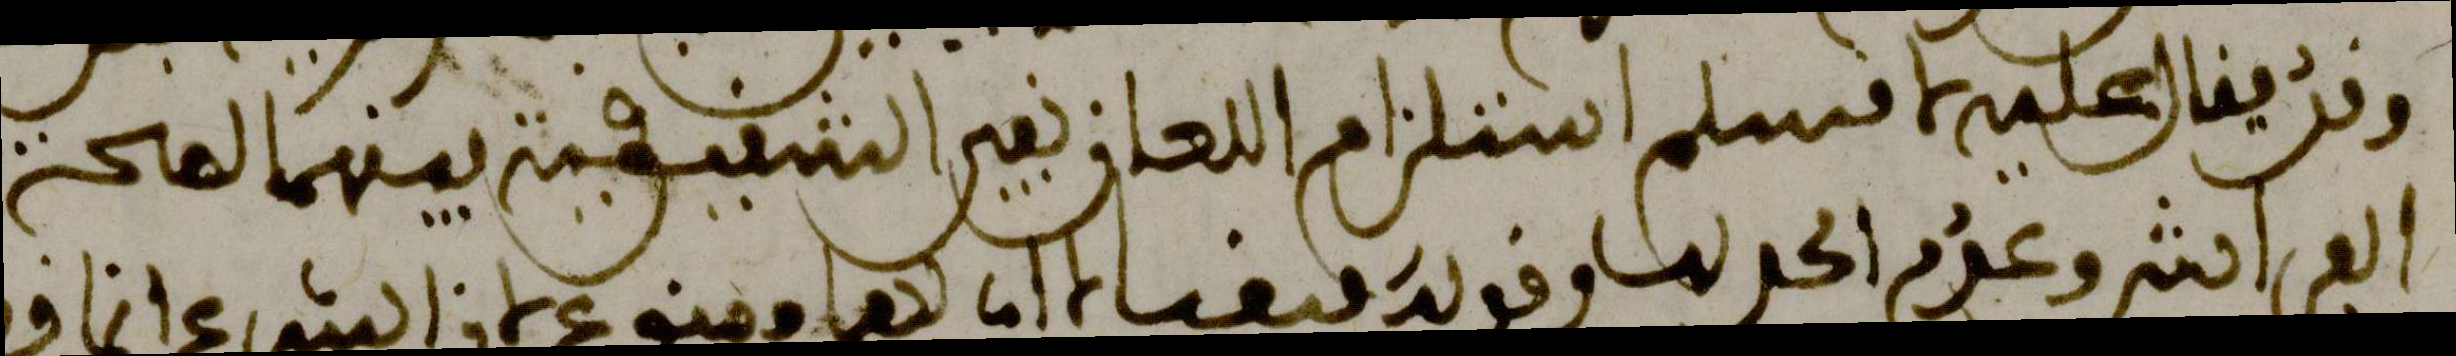و قد يقال عليه لا مسلم استلزام اللعان نفي الشقيقية بينهما لصحة
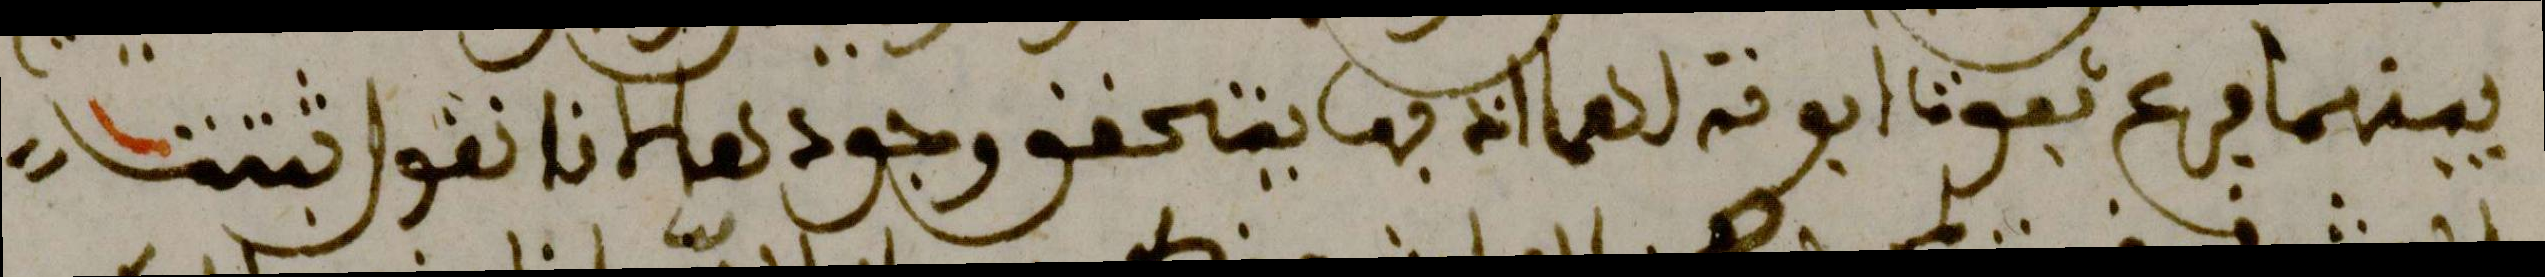بينهما فرع ثبوت ابوته لهما اذ بها يتحقق وجودها لان نقول ثبتت
